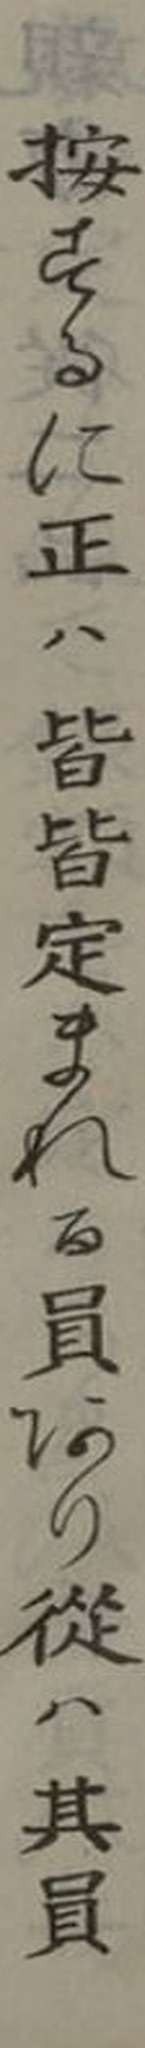按するに正は皆皆定まれる員あり從は其員
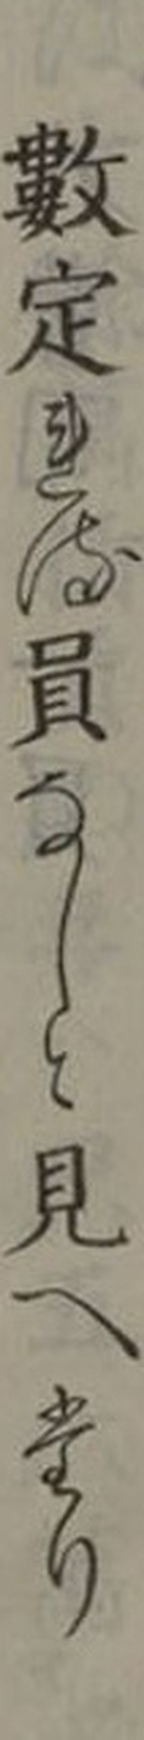數定れる員なしと見へたり
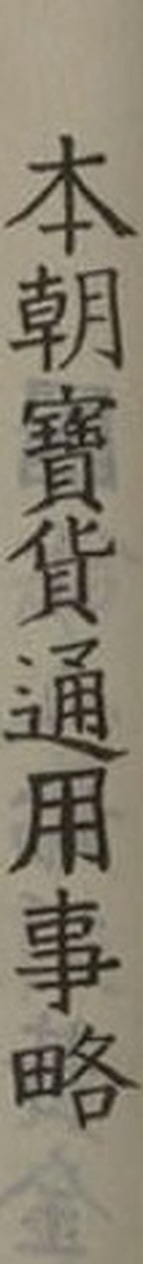本朝寶貨通用事略
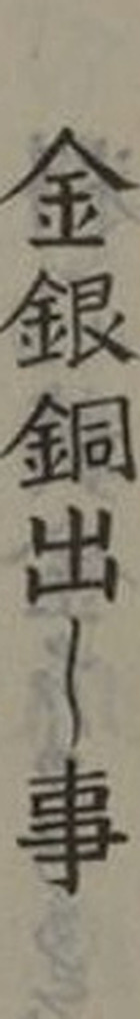金銀銅出し事
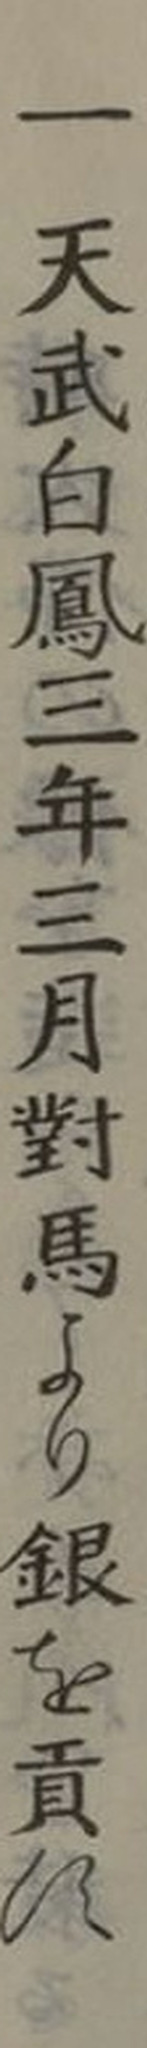一天武白鳳三年三月對馬より銀を貢す
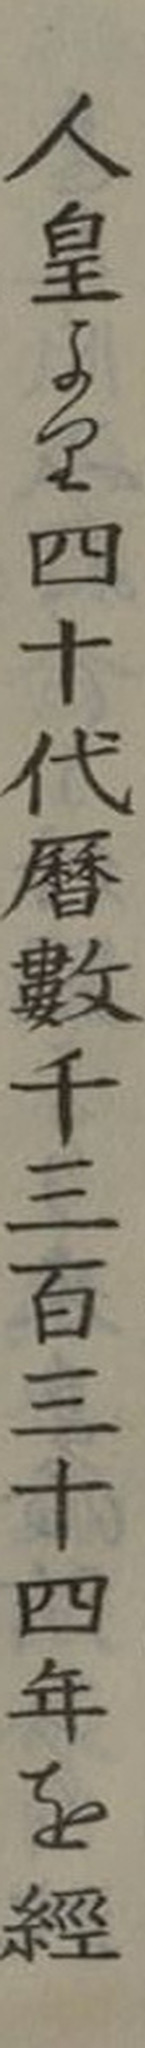人皇より四十代曆數千三百三十四年を經
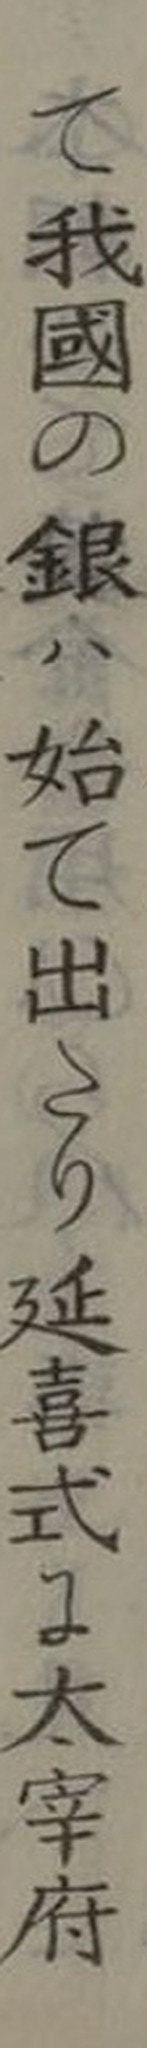て我國の銀は始て出たり延喜式に太宰府
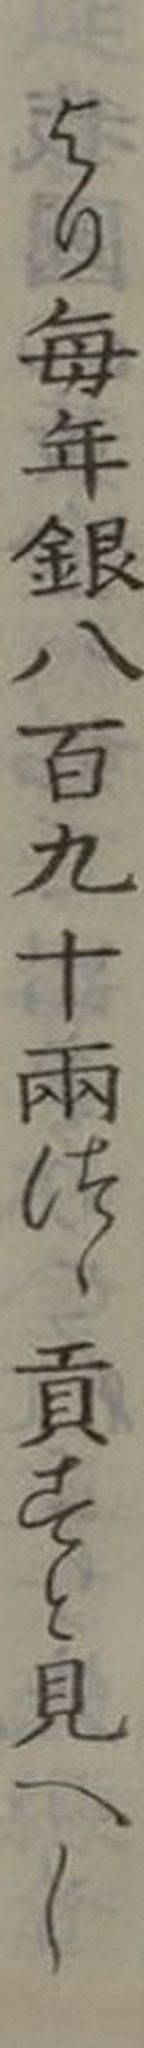より每年銀八百九十兩つつ貢すと見へし
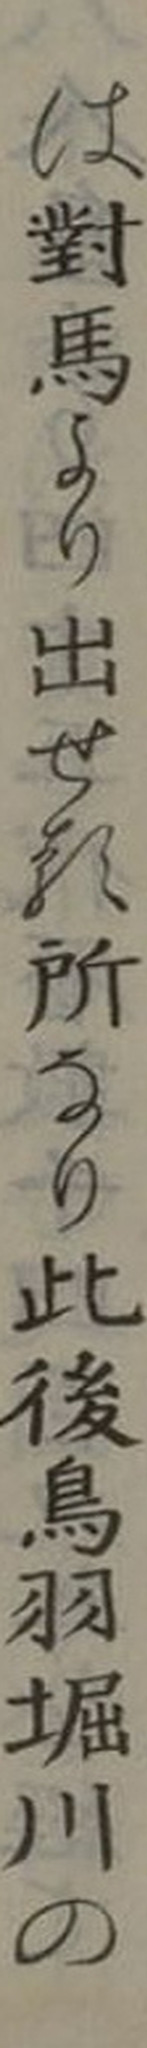は對馬より出せる所なり此後鳥羽堀川の
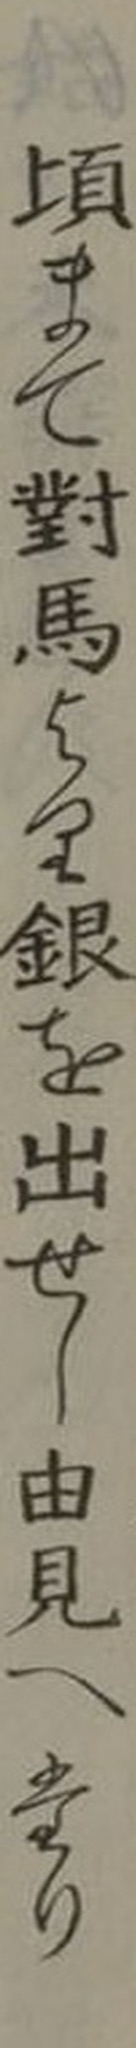頃まて對馬より銀を出せし由見へたり
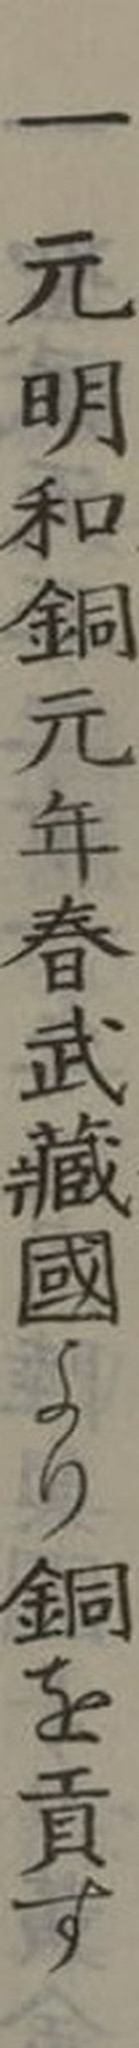一元明和銅元年春武藏國より銅を貢す
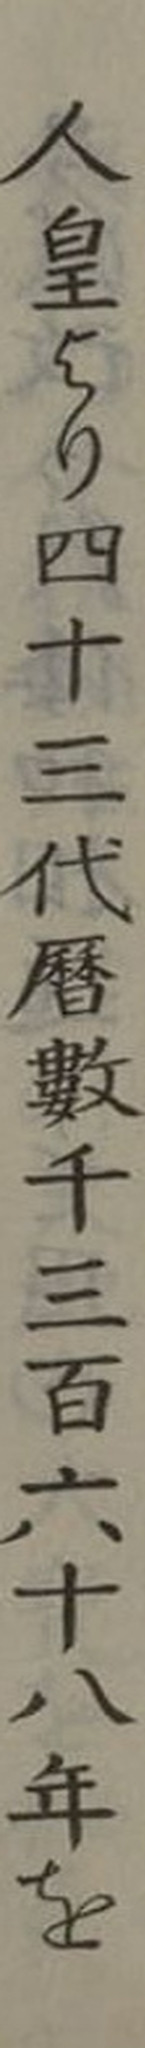人皇より四十三代曆數千三百六十八年を
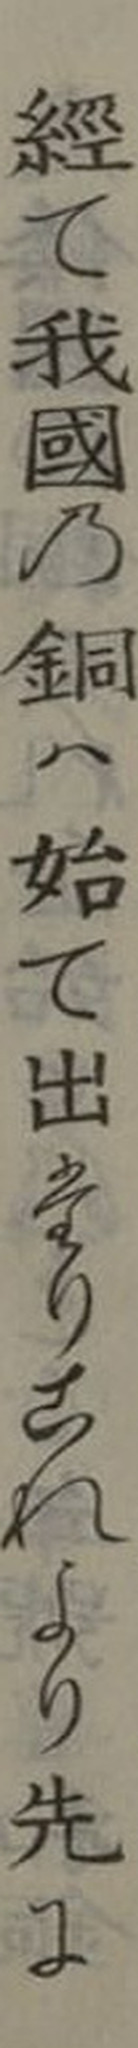經て我國の銅は始て出たりこれより先に
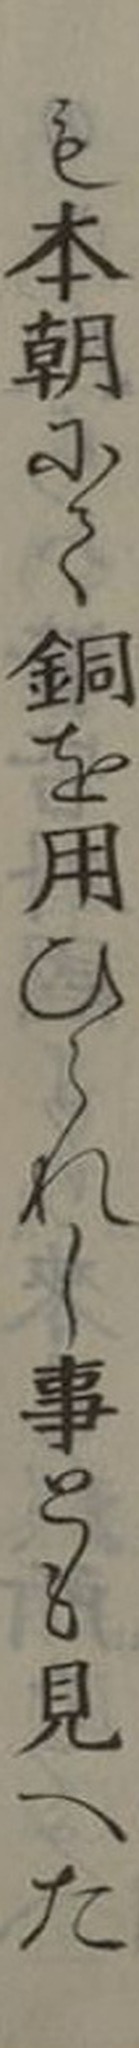も本朝にて銅を用ひられし事とも見へた

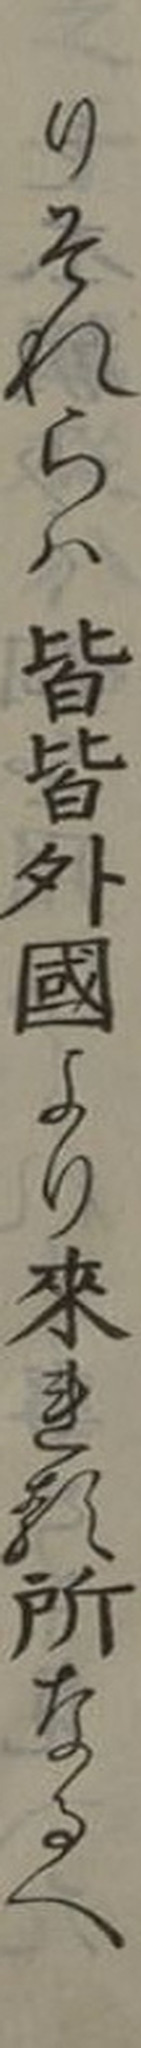りそれらは皆皆外國より來れる所なるへ
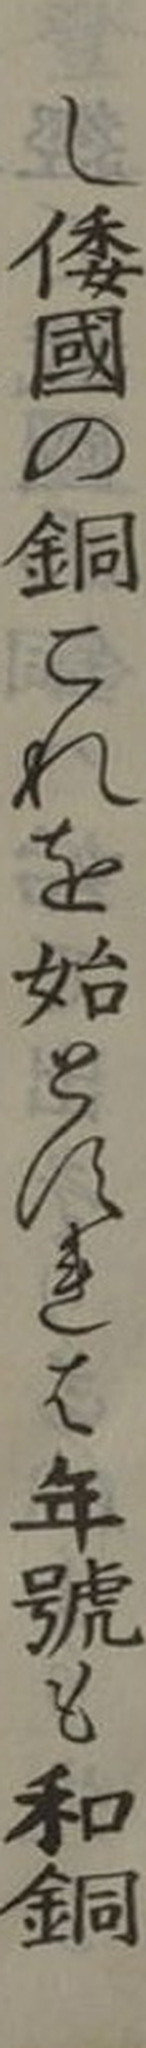し倭國の銅これを始とすれは年號も和銅
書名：骨董録
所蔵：University of the Ryukyus Library
